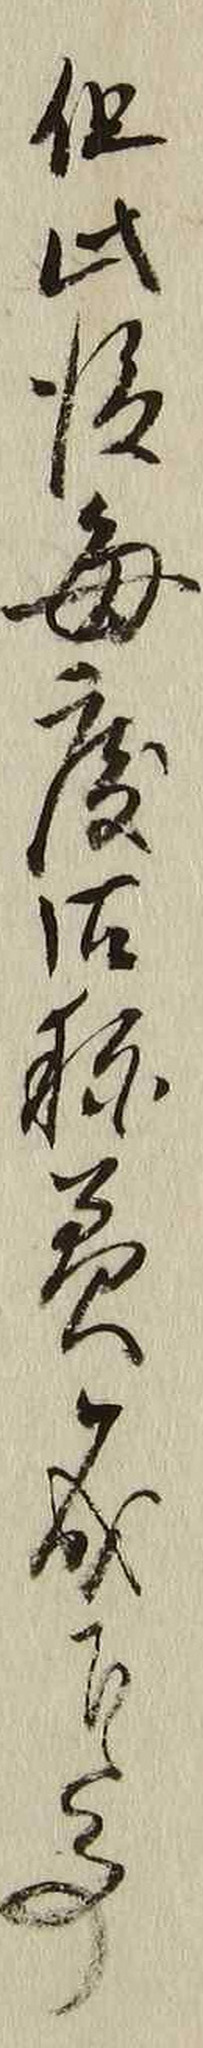但此後毎度御称美被成下候事
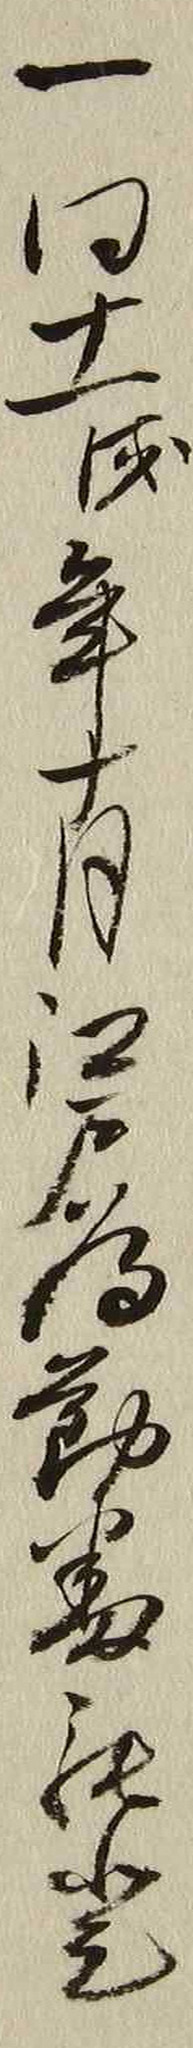一同十一戌年十月江戸為勤番罷登
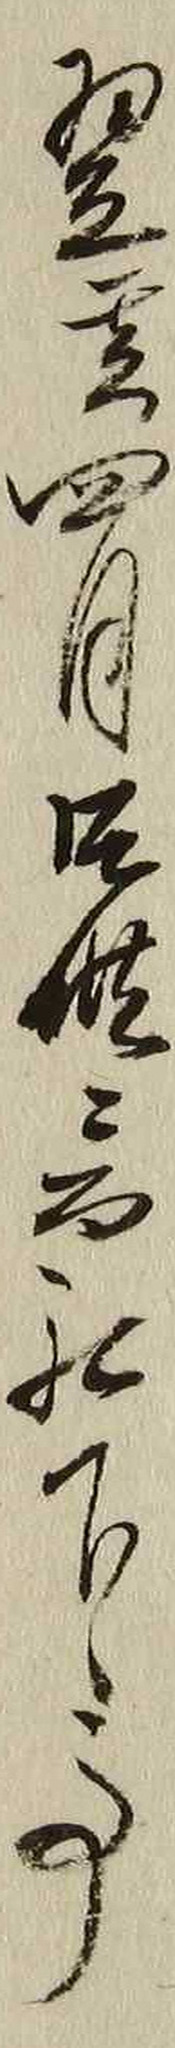翌亥四月御供ニ而罷下候事
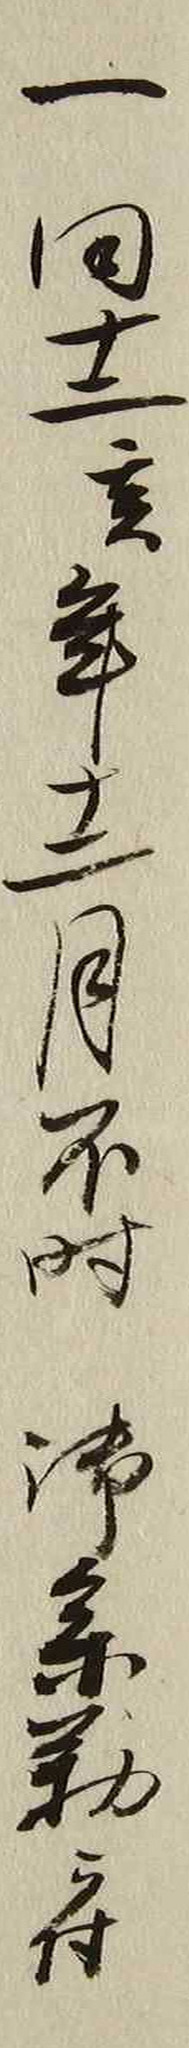一同十二亥年十二月不時御参勤ニ付
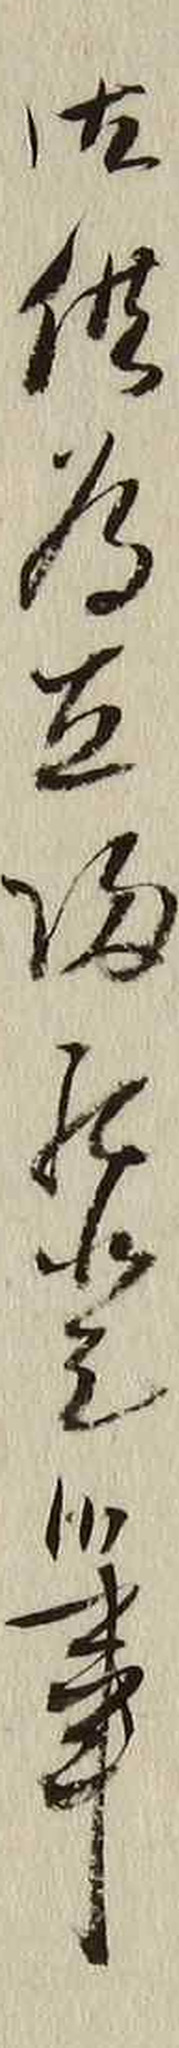御供為立帰罷登候事
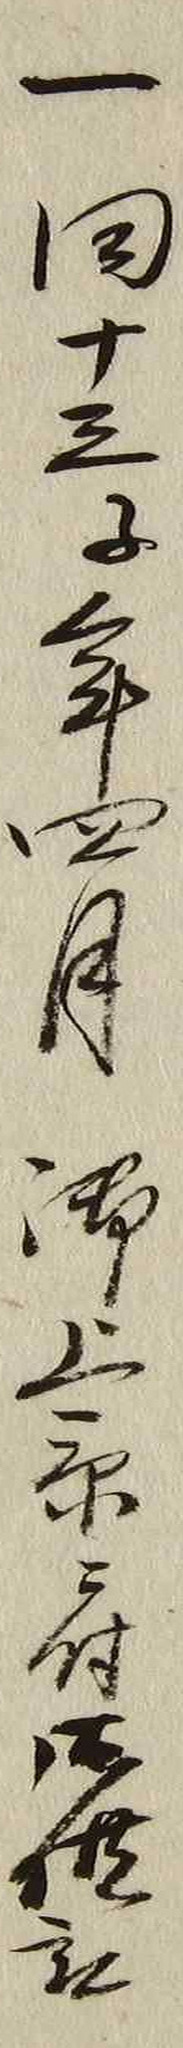一同十三子年四月御上京ニ付御供被
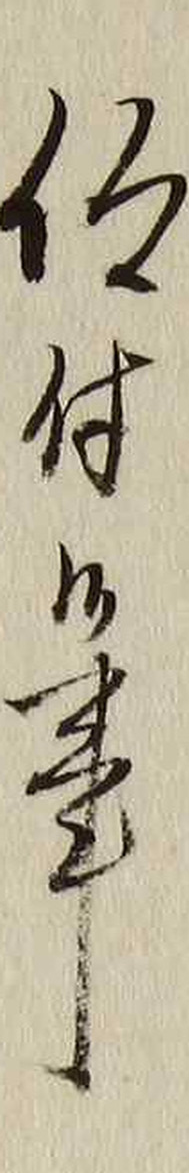仰付候事
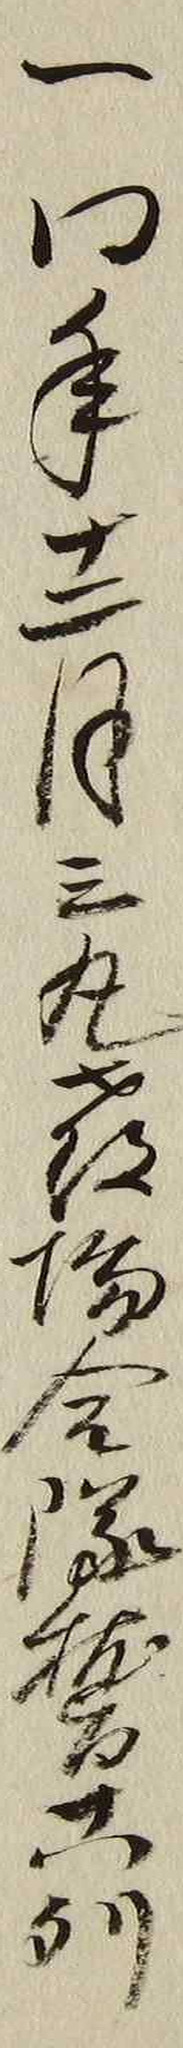一同年十二月三丸教場合隊稽古列
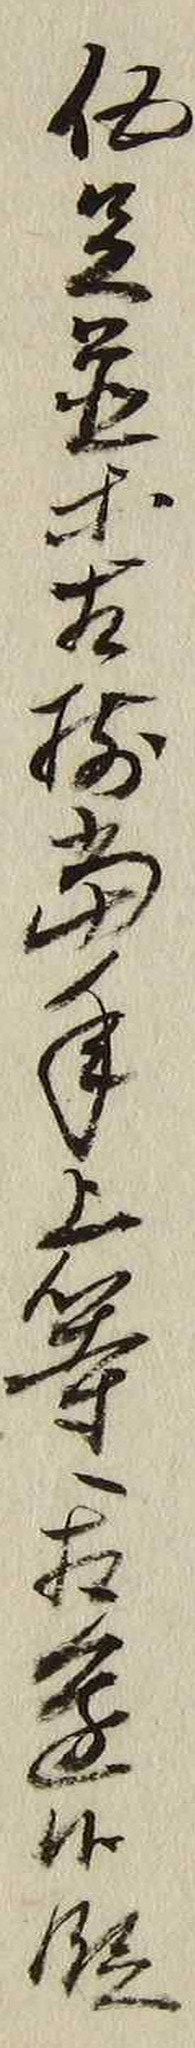伍足並等相揃当年上等へ相進候段
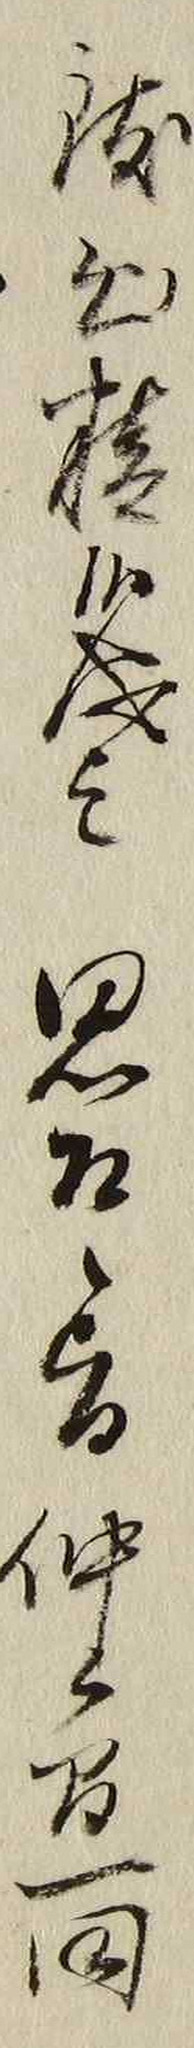致出精候儀之思召之旨仲ヶ間一同
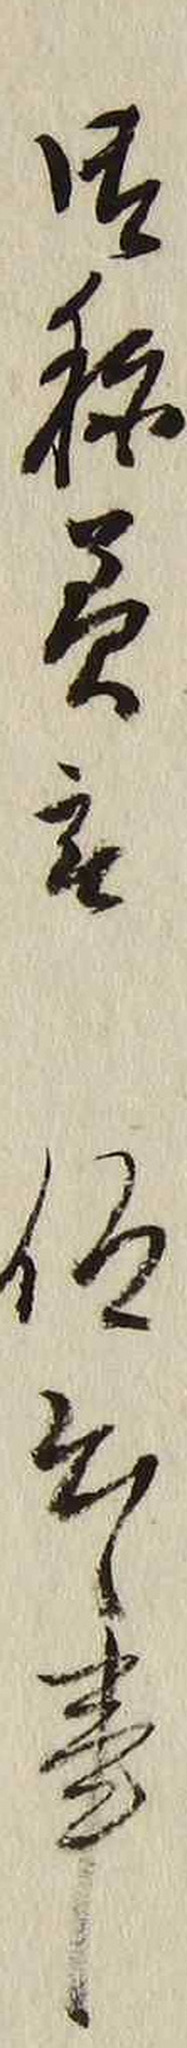御称美被仰出候事
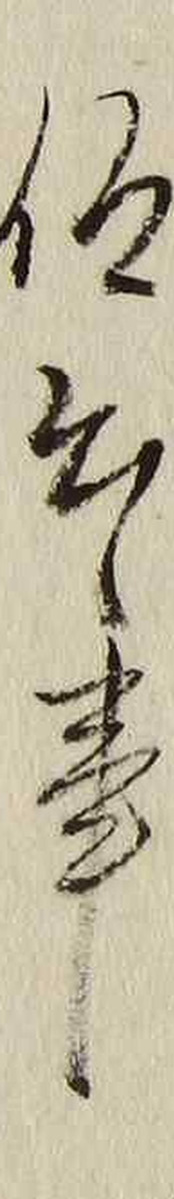仰付候事
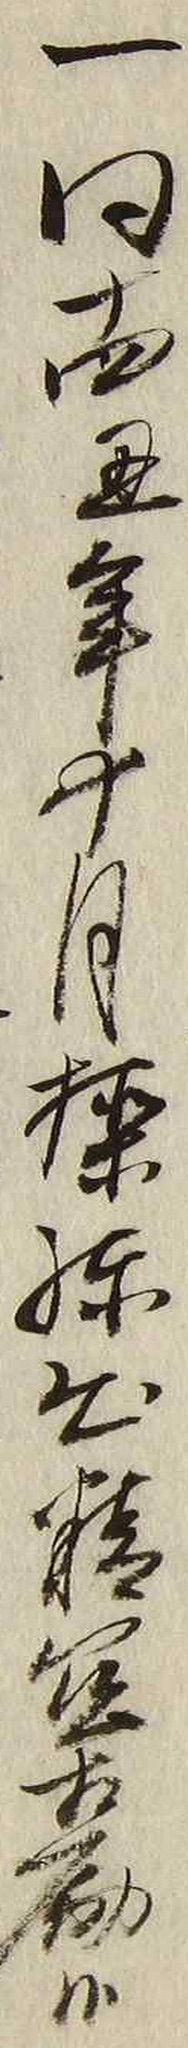一同十四丑年十月操練出精宜相励候
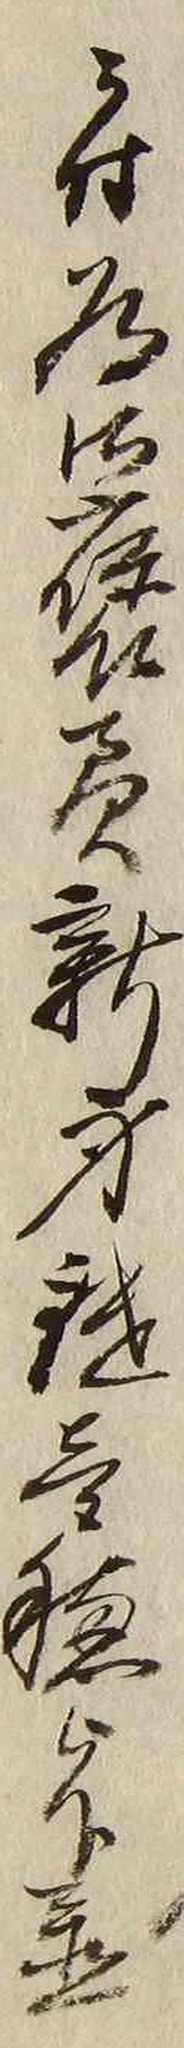ニ付為御褒美新身鑓壱穂被下置

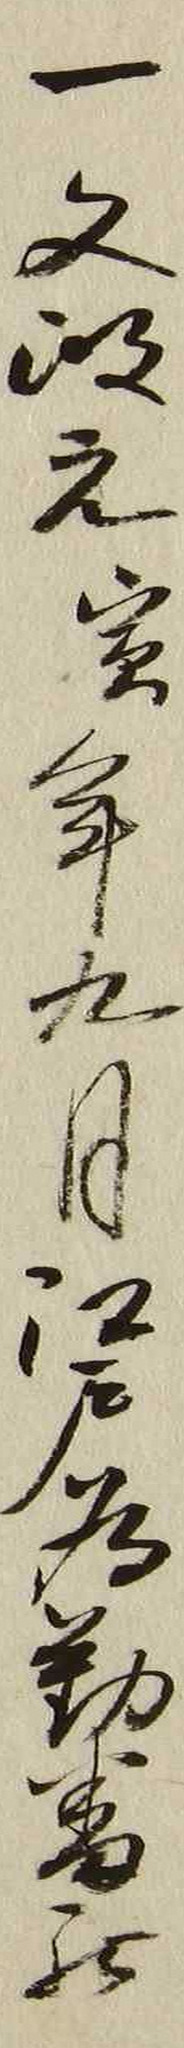一文政元寅年九月江戸為勤番罷
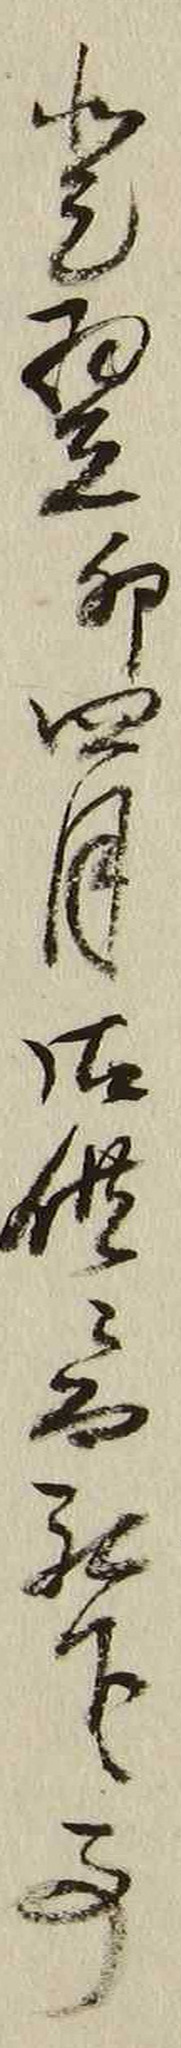登翌卯四月御供ニ而罷下候事
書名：諸士系譜　巻之352　す之部2
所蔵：会津若松市立会津図書館
